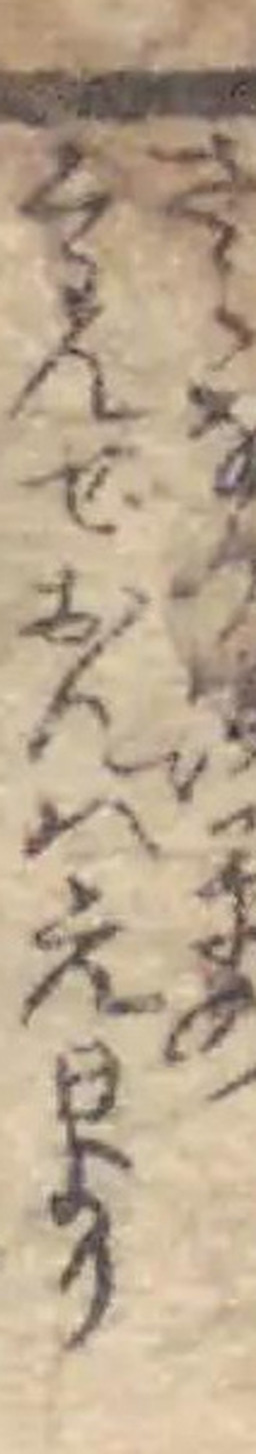くわんぜおんハ元日より
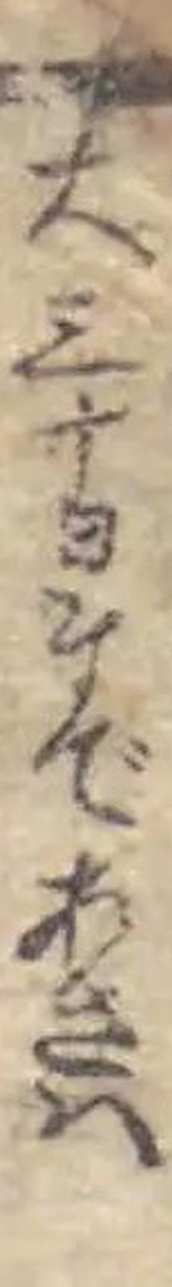大三十日まであさハ
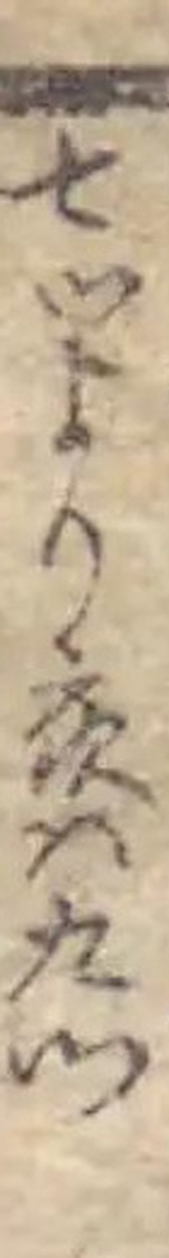七つおり夜ハ九つ
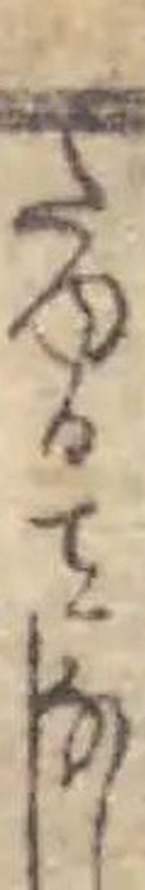たゆることなし
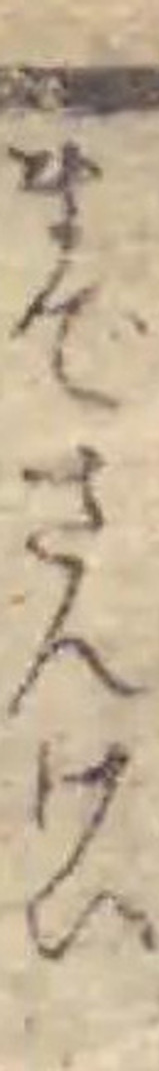までさんけい
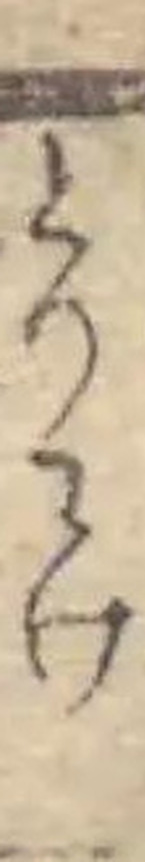とりわけ
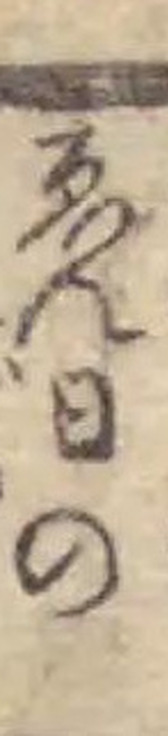ゑん日の
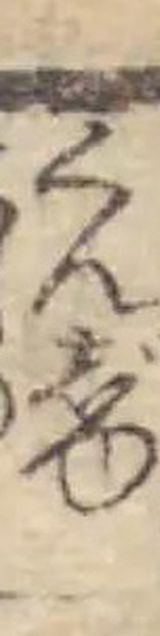くんじゆ
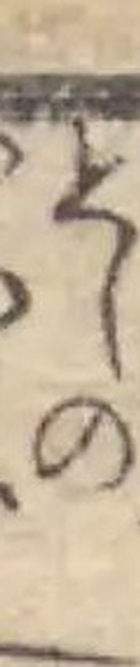としの
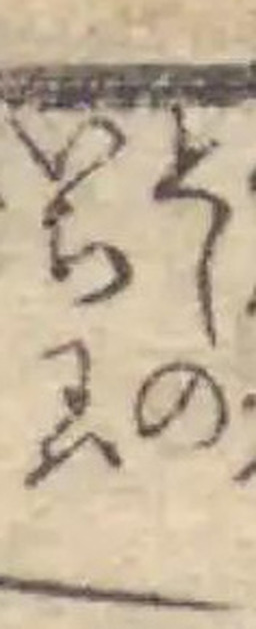いちにハ
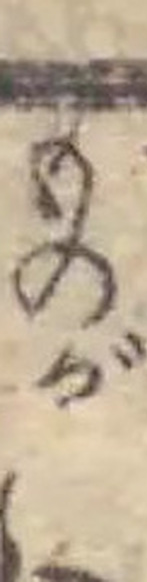ものが
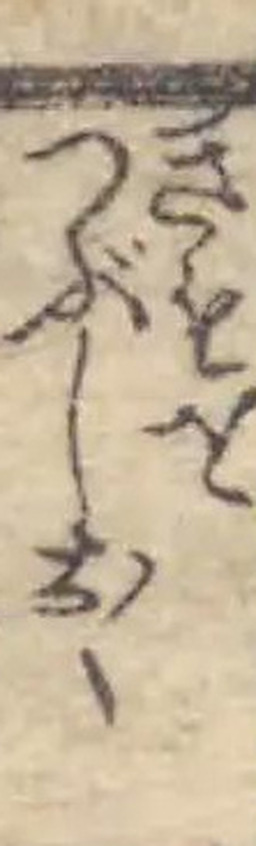つぶしおゝ
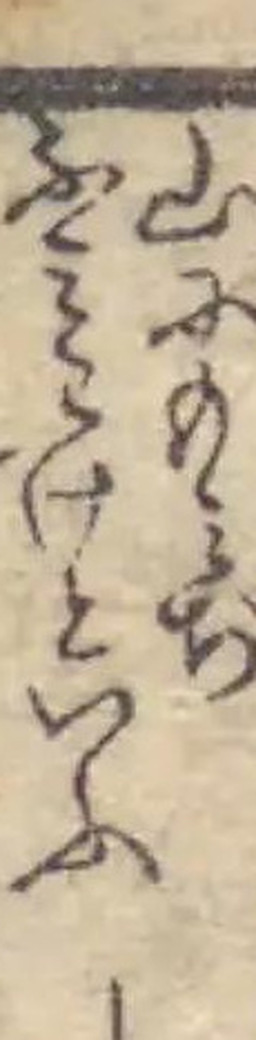ふミわけといふ
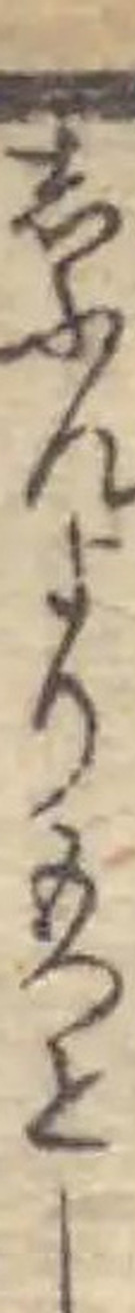しふんよりもつと
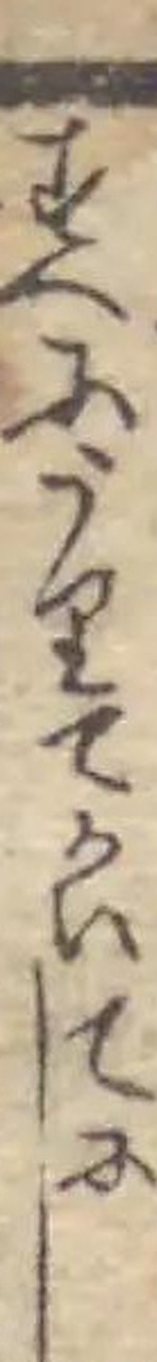すへにうりてかいてに
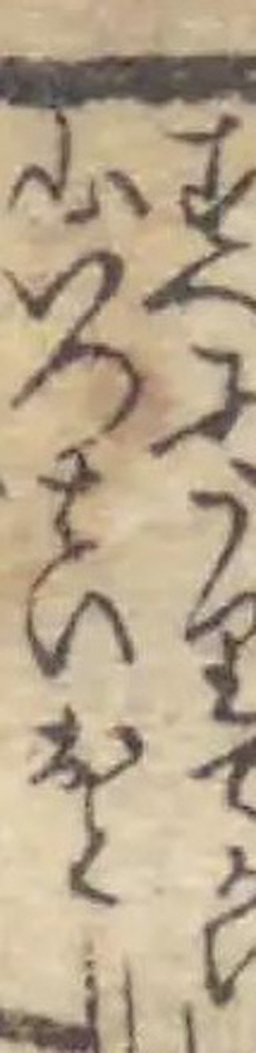山いつはいおと
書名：豆男江戸見物 2巻
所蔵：国立国会図書館 National Diet Library, JAPAN
